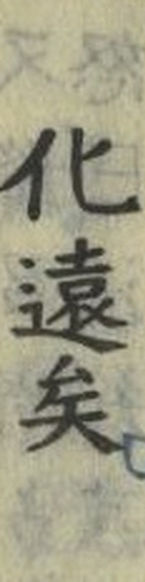化遠矣。
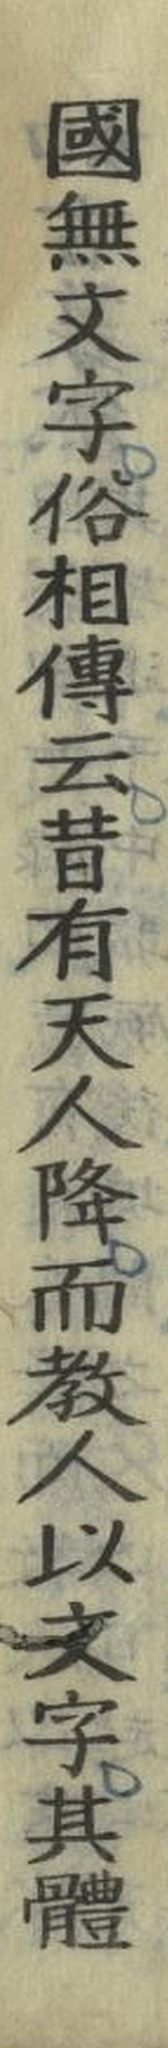國無文字。俗相傳云。昔有天人降。而教人以文字。其體

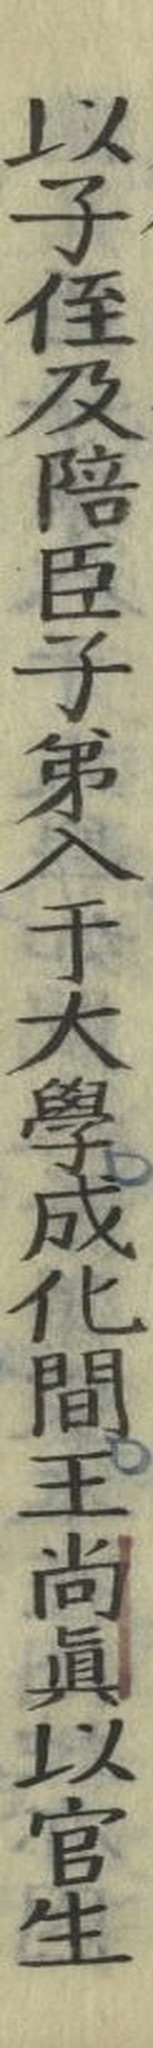以子侄及陪臣子弟入于大學。成化間。王尚眞以官生
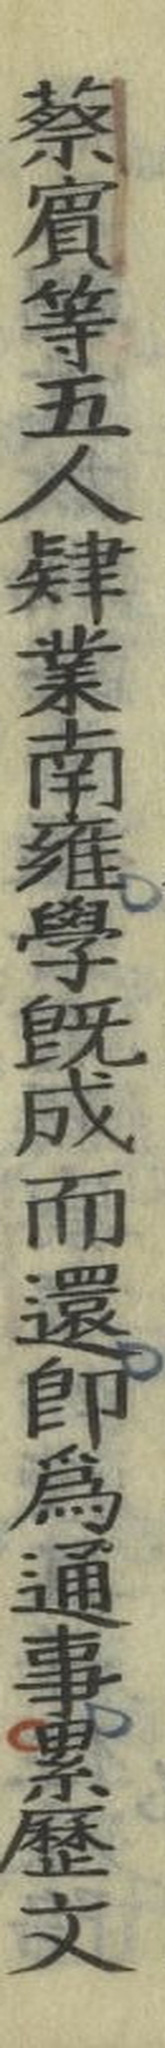蔡賔等五人肄業南雍。學既成而還。卽爲通事。累歷文
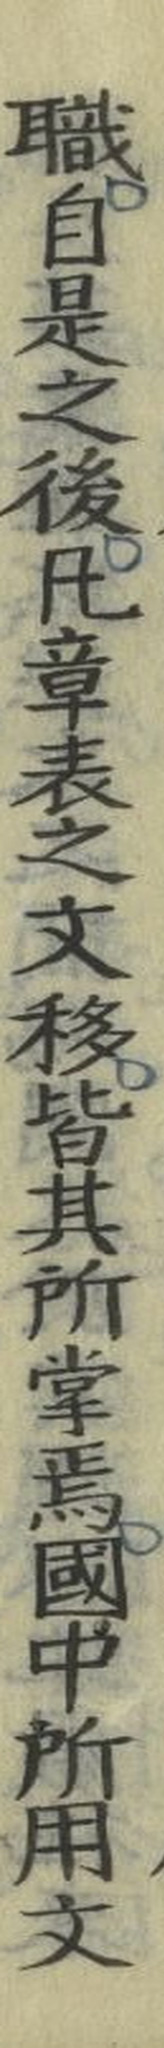職。自是之後。凡章表之文移。皆其所掌焉。國中所用文
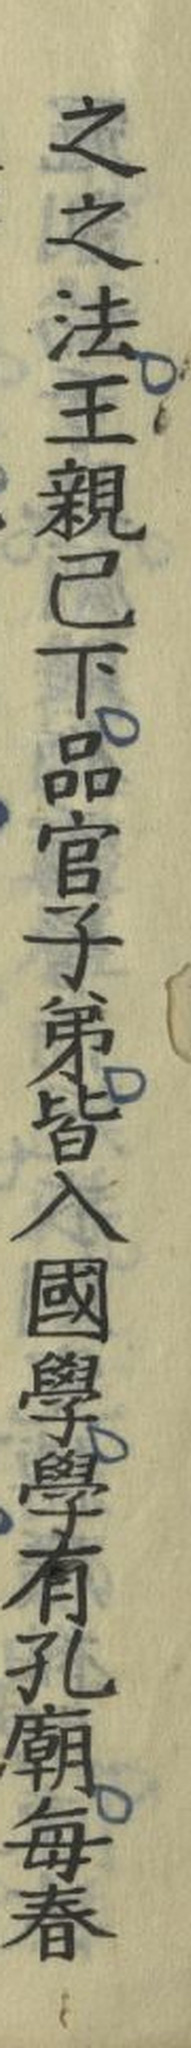之之法。王親已下。品官子弟。皆入國學。學有孔廟。毎春
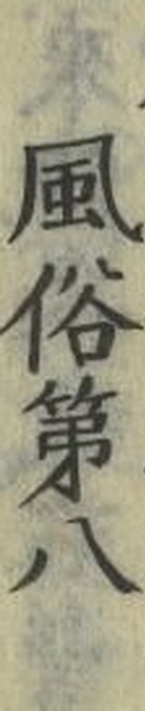風俗第八
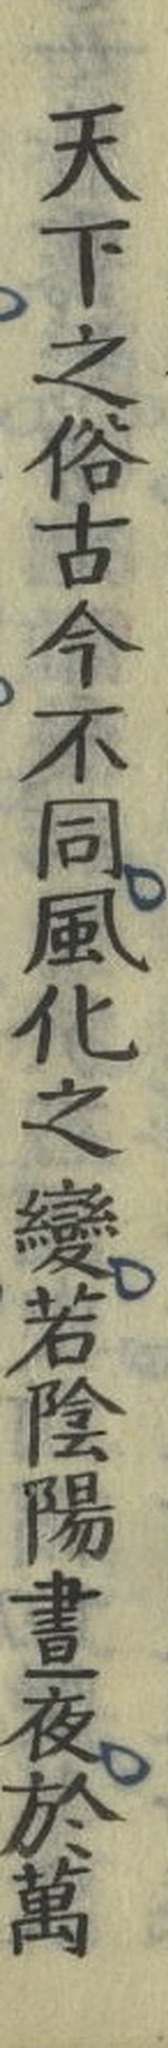天下之俗古今不同。風化之變。若陰陽晝夜。於萬
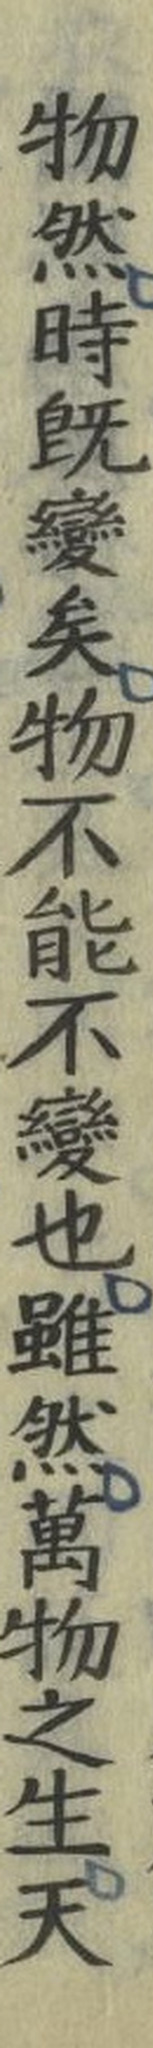物然。時既變矣。物不能不變也。雖然。萬物之生。天
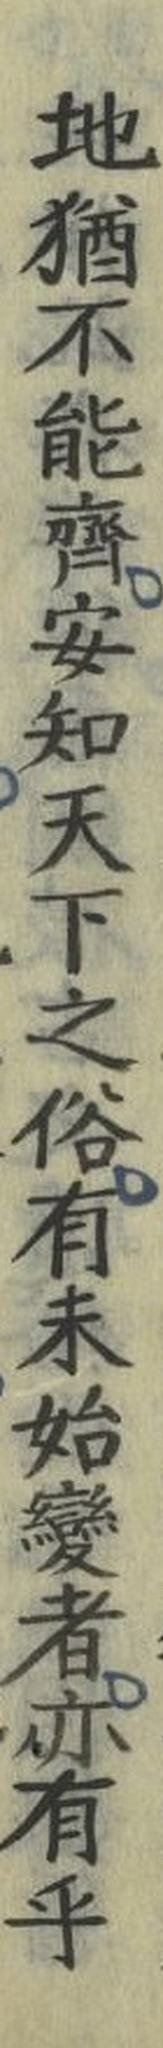地猶不能齊。安知天下之俗。有未始變者。亦有乎
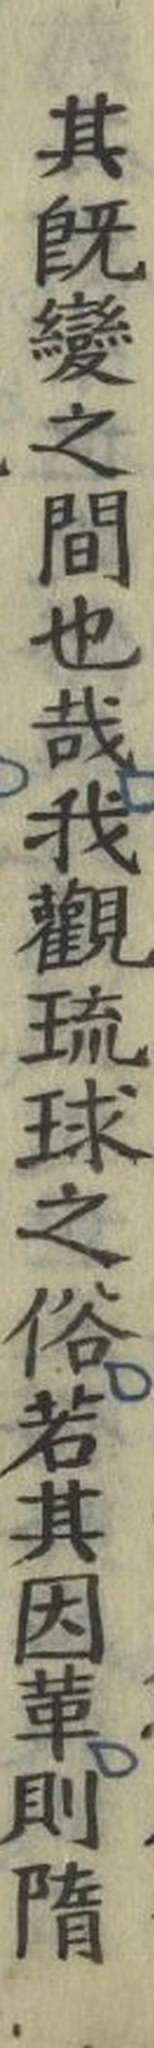其既變之間也哉。我觀琉球之俗。若其因革。則隋
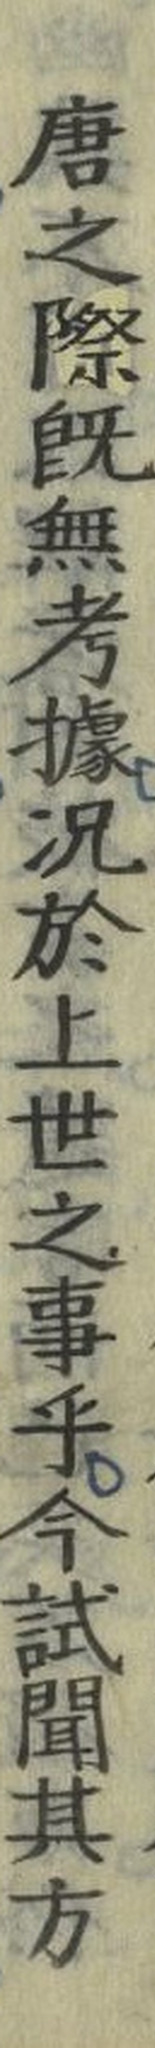唐之際。既無考據。况於上世之事乎。今試聞其方
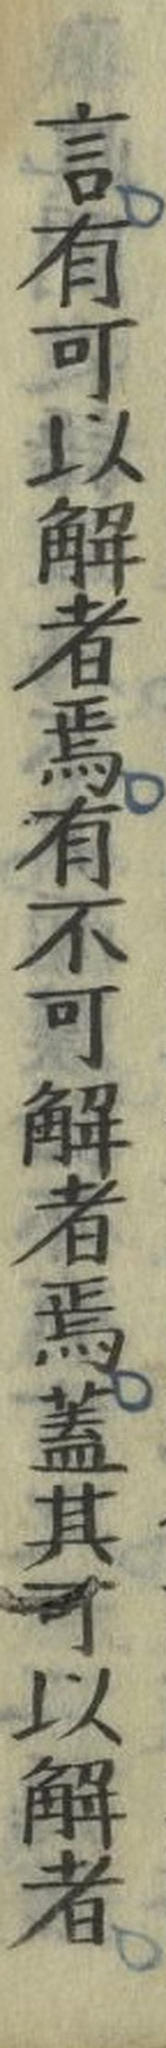言。有可以解者焉。有不可解者焉。蓋其可以解者。

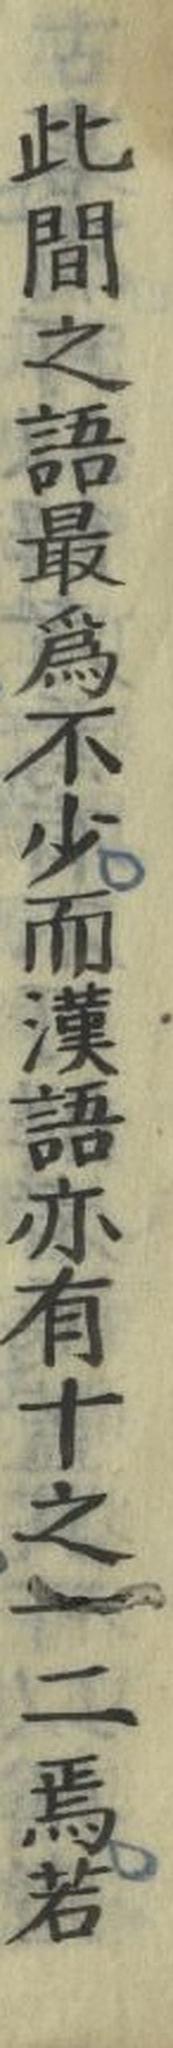此間之語最爲不少。而漢語亦有十之一二焉。若
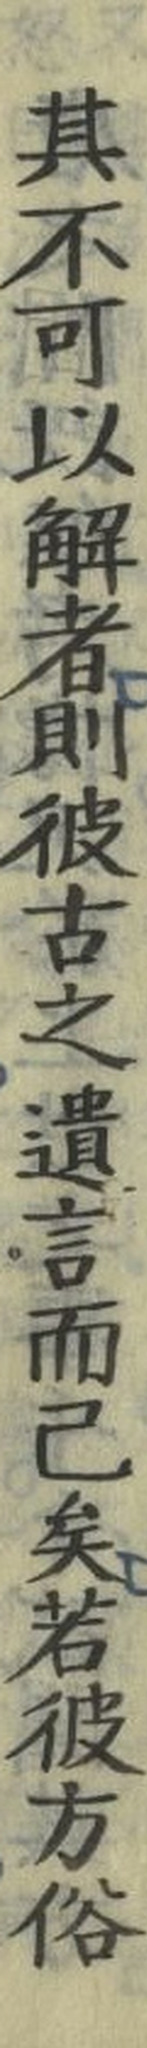其不可以解者。則彼古之遺言而已矣。若彼方俗
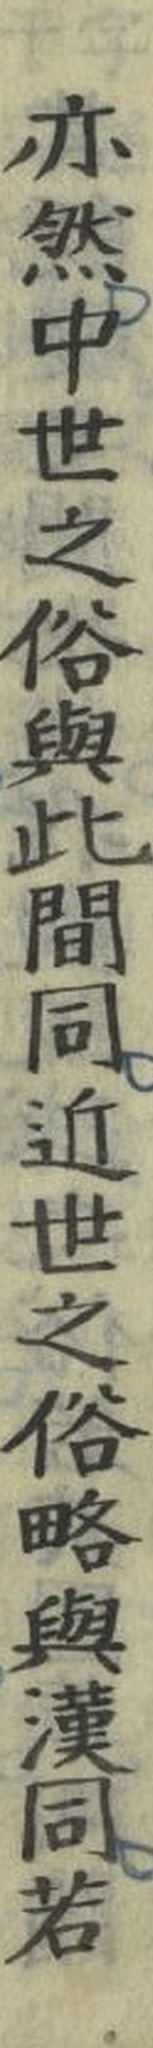亦然。中世之俗與此間同。近世之俗略與漢同。若
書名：南島志
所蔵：University of the Ryukyus Library
